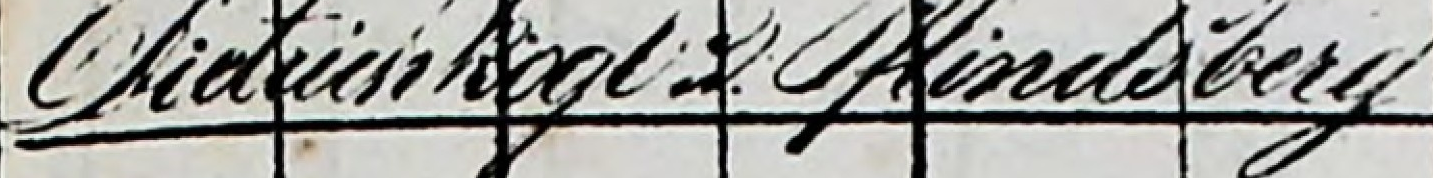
Dietrichkogl u. Pflindsberg
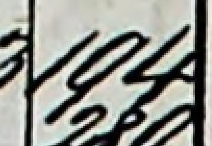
194
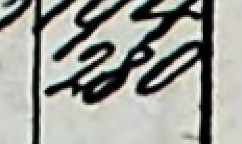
280
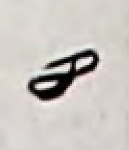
8
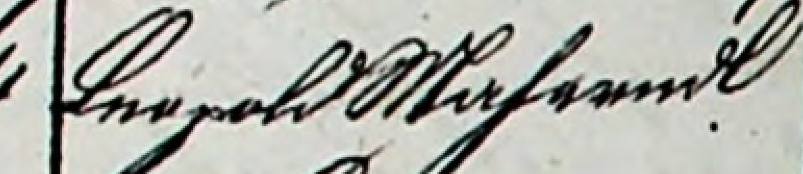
Leopold Maherndl
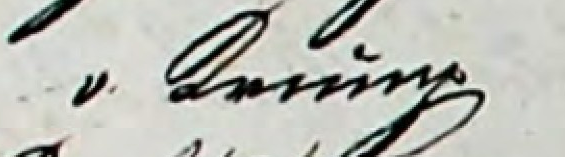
v. Krung
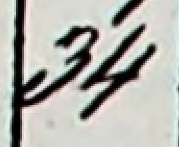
34
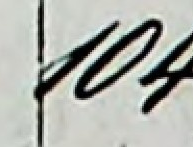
104
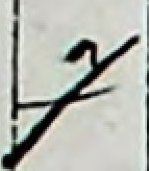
7
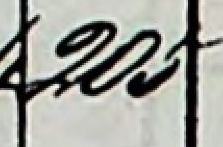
205
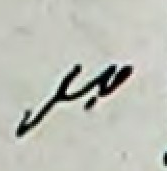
do
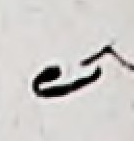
5
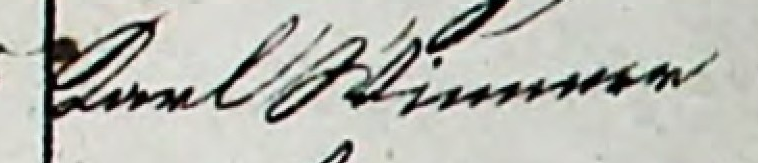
Karl Wimmer
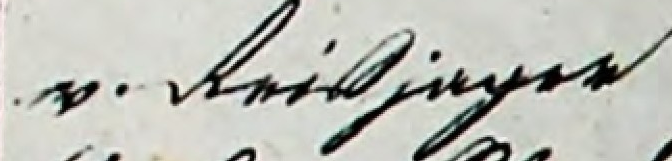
v. Reisjager
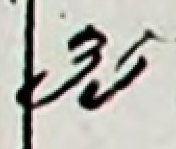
35
